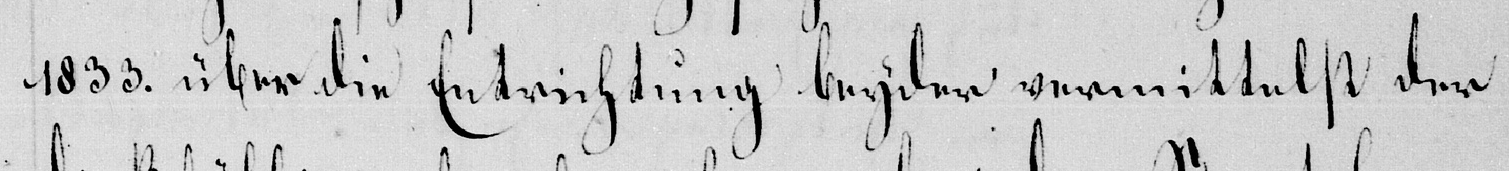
1833. über die Entrichtung beyder vermittelst der
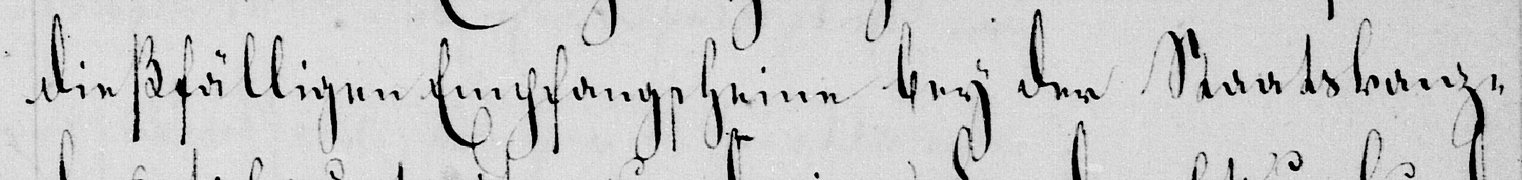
dießfälligen Empfangscheine bey der Staatskanz¬
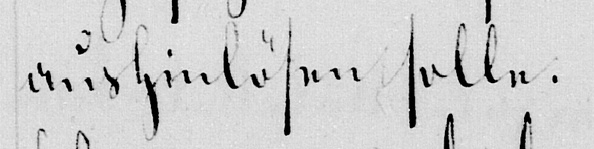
aushinlösen solle.
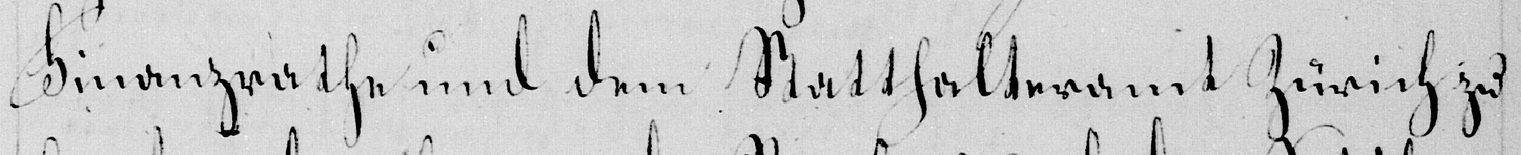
Finanzrathe und dem Statthalteramt Zürich zu
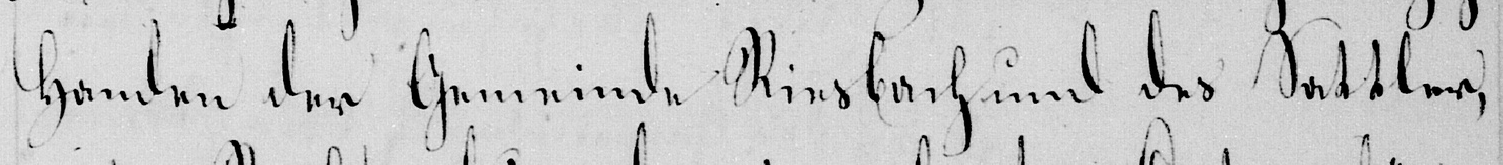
Handen der Gemeinde Riesbach und des Sattler,
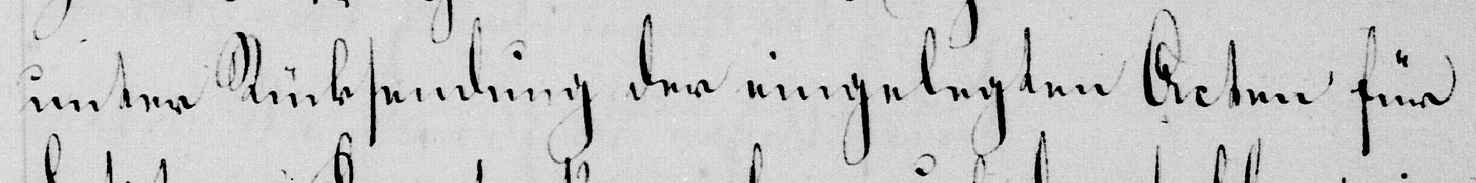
unter Rücksendung der eingelegten Acten für
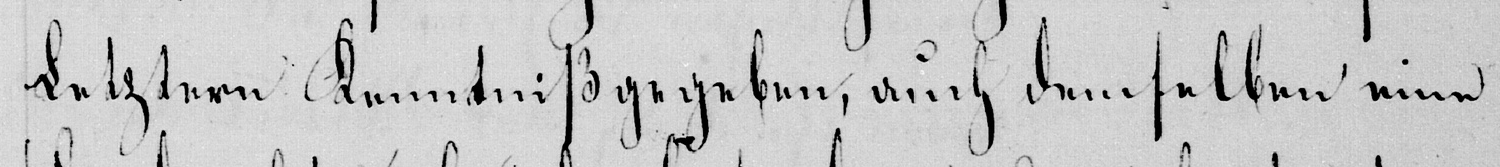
Letztern Kenntniß gegeben, auch demselben eine
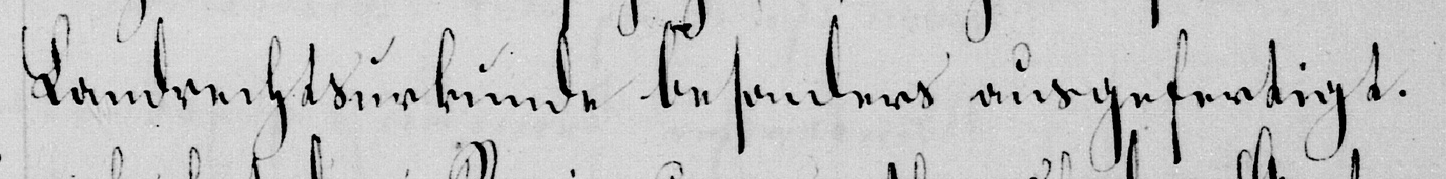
Landrechtsurkunde besonders ausgefertigt.
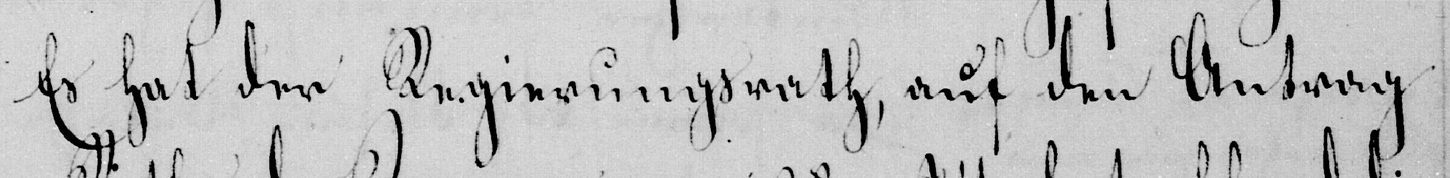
Es hat der Regierungsrath, auf den Antrag
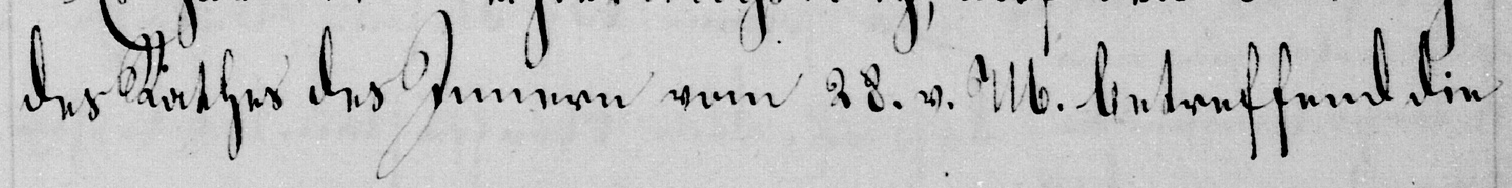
des Rathes des Innern vom 28. v. M. betreffend die
